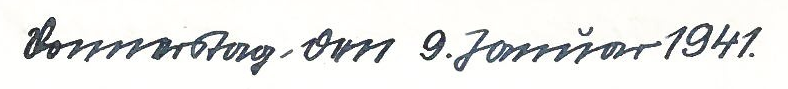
Donnerstag, den 9. Januar 1941.
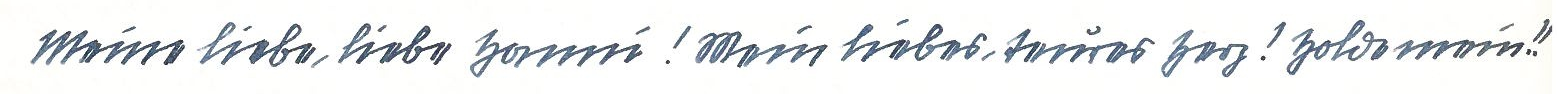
Meine liebe, liebe ! Mein liebes, teures Herz! Holde mein!!
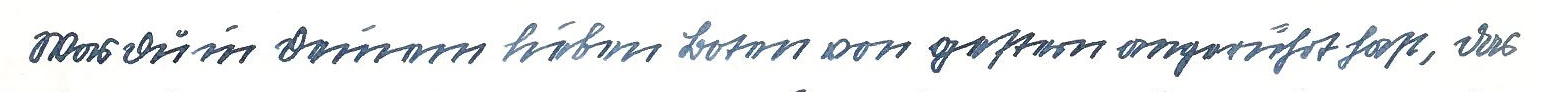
Was Du in Deinem lieben Boten von gestern angerührt hast, das
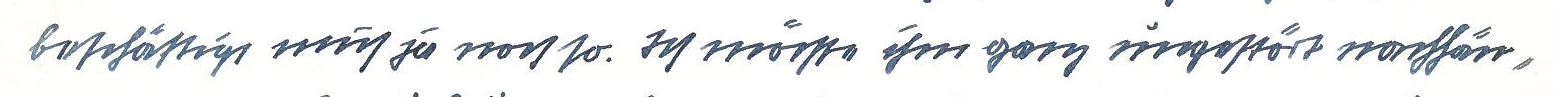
beschäftigt mich ja noch so. Ich möchte ihm ganz ungestört nachhän¬
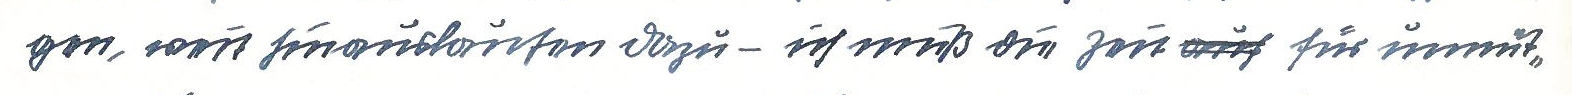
gen, weit hinauslaufen dazu – ich muß die Zeit auf für unnüt¬
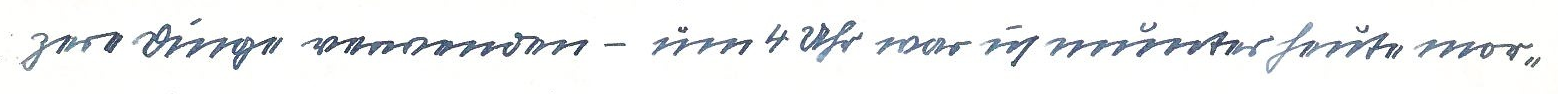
zere Dinge verwenden – um 4 Uhr war ich munter heute mor¬
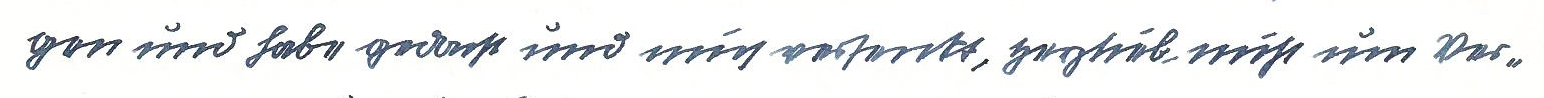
gen und habe gedacht und mich versenkt, Herzlieb, nicht um Ver¬
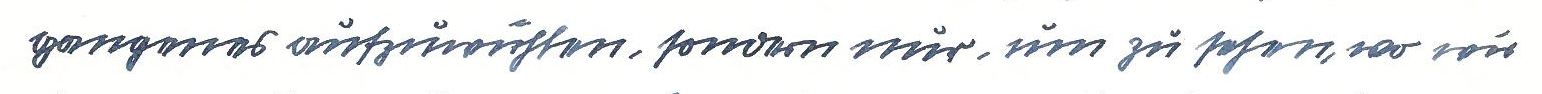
gangenes aufzuwühlen, sondern nur, um zu sehen, wo wir
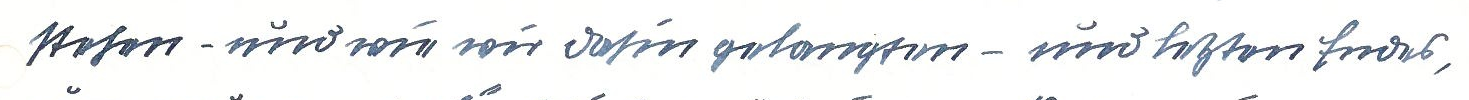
stehen – und wie wir dahin gelangten – und letzten Endes,
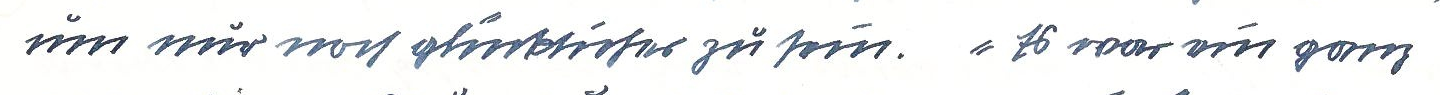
um nur noch glücklicher zu sein. „Es war ein ganz
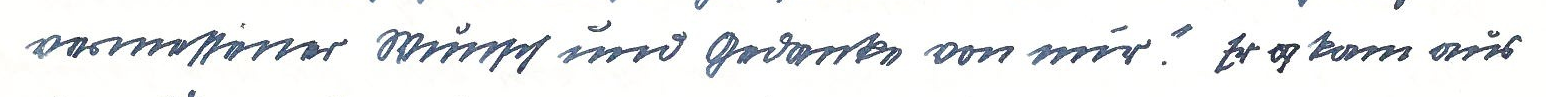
vermessener Wunsch und Gedanke von mir.“ Er q kam aus
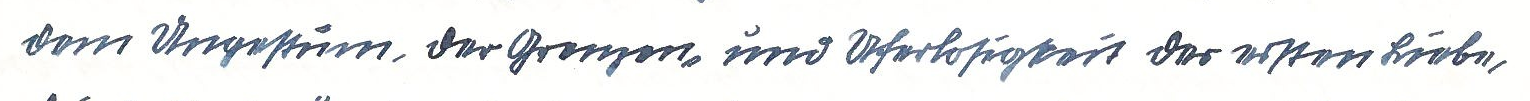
dem Ungestüm, der Grenzen- und Uferlosigkeit der ersten Liebe,
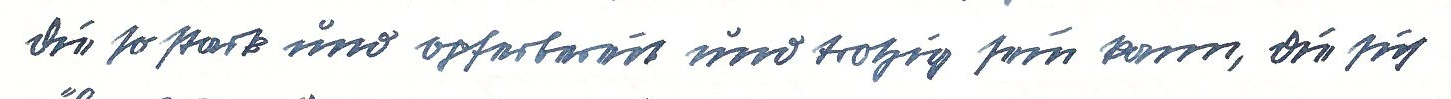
die so stark und opferbereit und trotzig sein kann, die sich
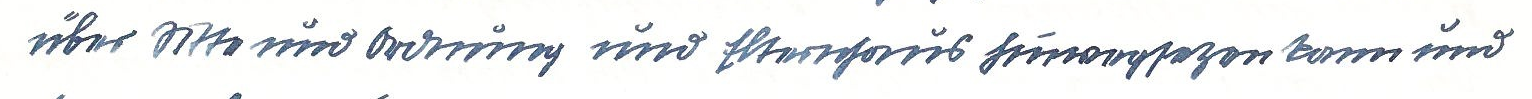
über Sitte und Ordnung und Elternhaus hinwegsetzen kann und
